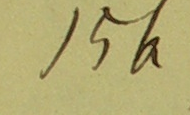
156
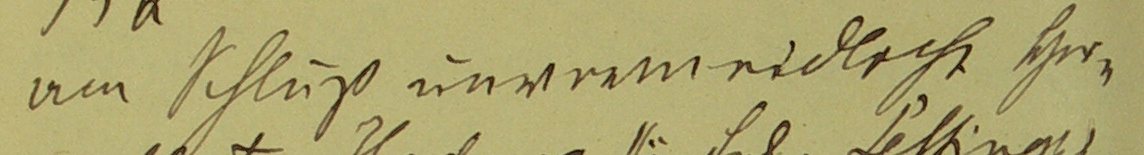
am Schluß unvermeidliche Hei¬
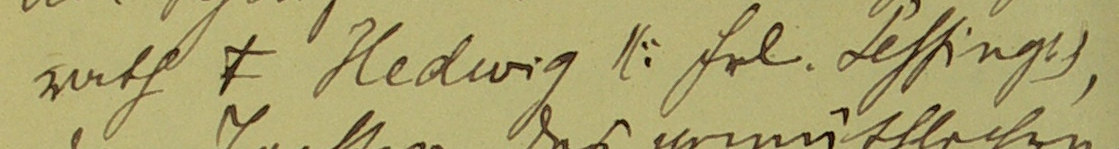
rat mit Hedwig (: Frl. Lessing: )
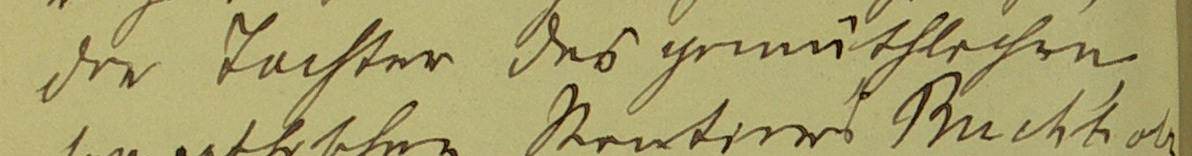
der Tochter des gemütlichen ,
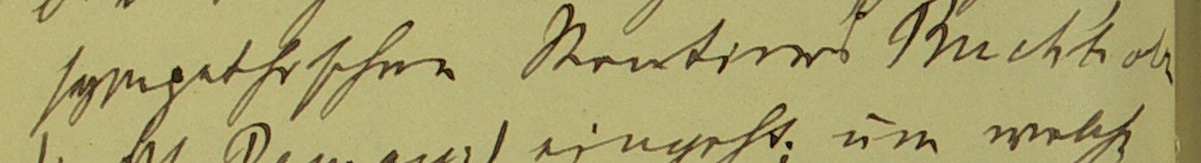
sympathischen Rentiers Buchholz
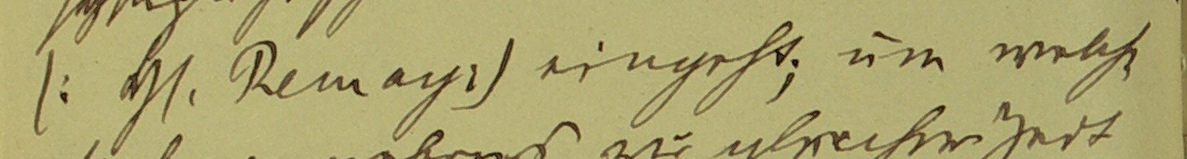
( : H. Remay : ) eingeht; um welche
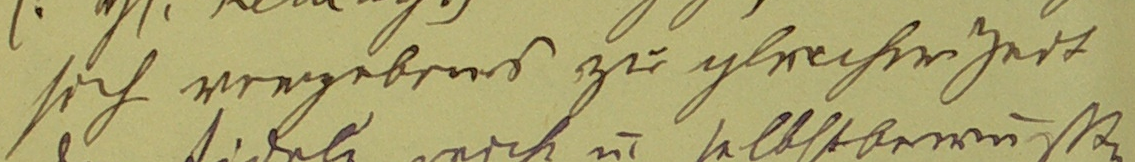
sich zu gleicher Zeit
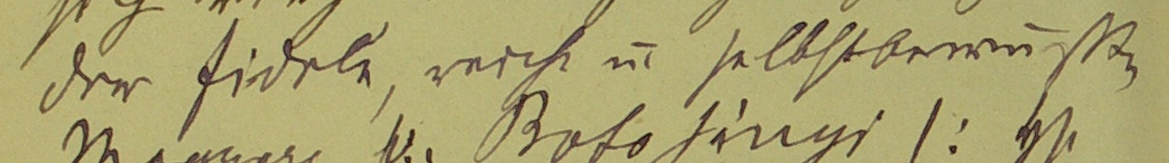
der fidele, selbsbewußte
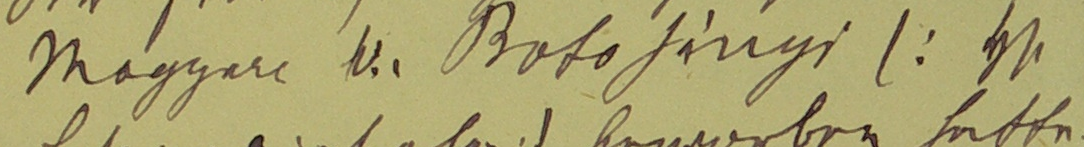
Magyare V. Botohanyi ( : H.
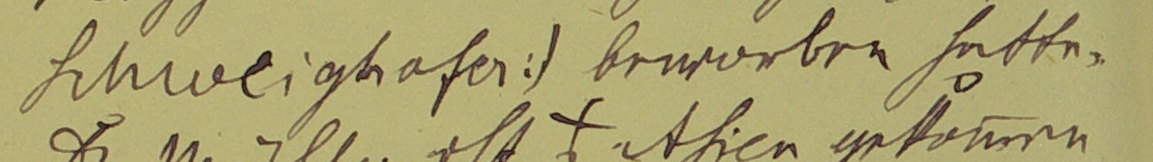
Schweighofer : ) beworben hatte.
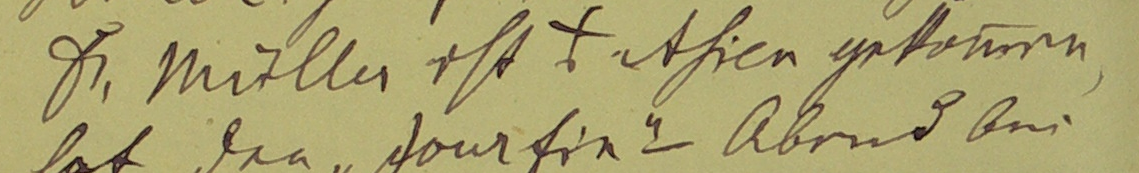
Dr.Miller ist aus Asien gekommen
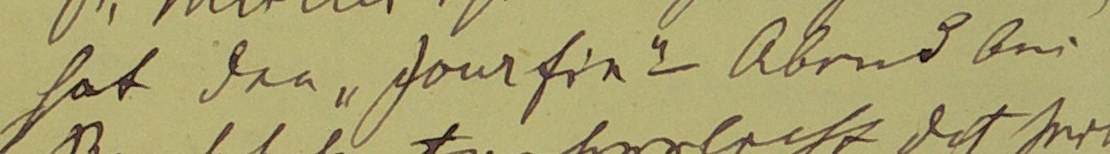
hat den „Jour-fix“- Abend bei
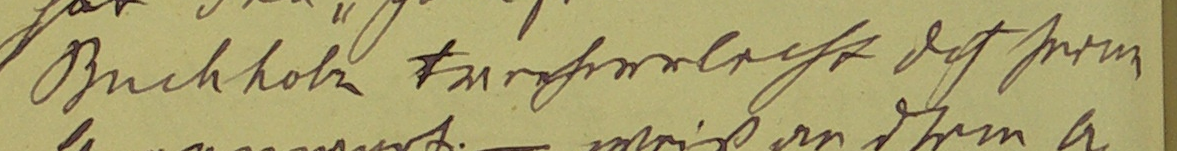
Buchholz verherrlicht durch seine
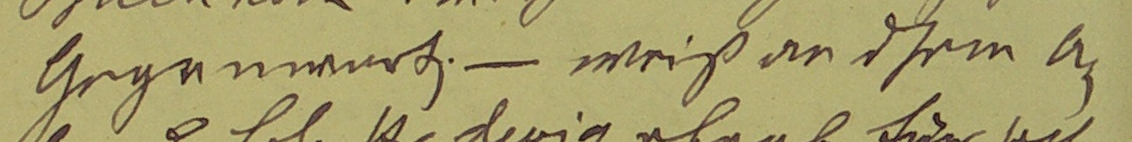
Gegenwart.- weiß an diesem A¬
